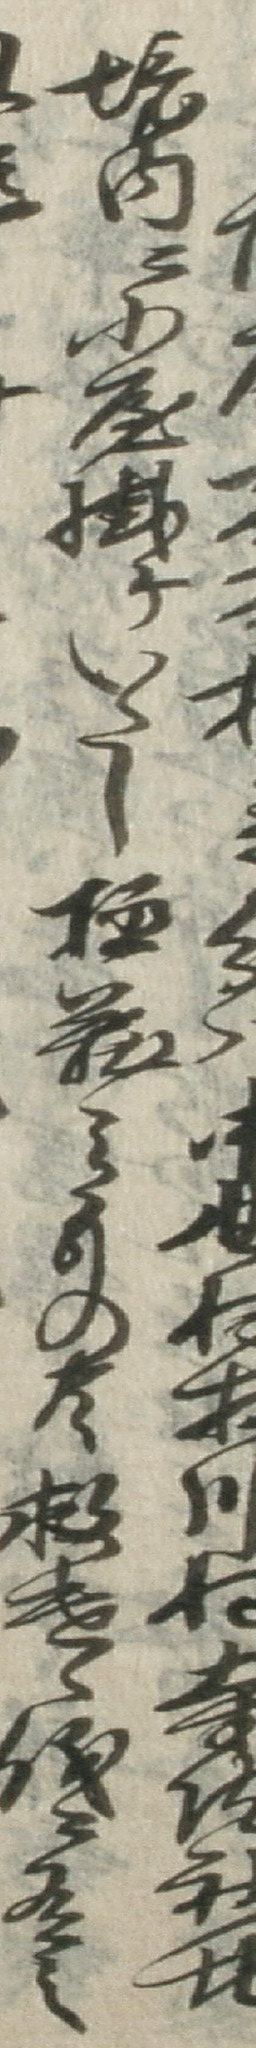境内二小屋掛ヶいたし極難之もの共救遣候儀二有之
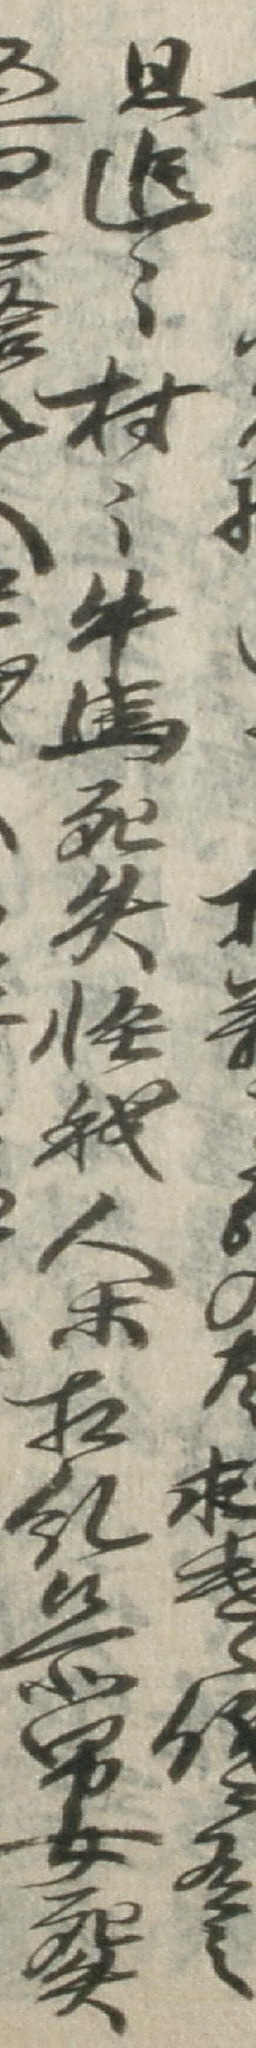且追々村々牛馬死失怪我人等相糺候所男女死失
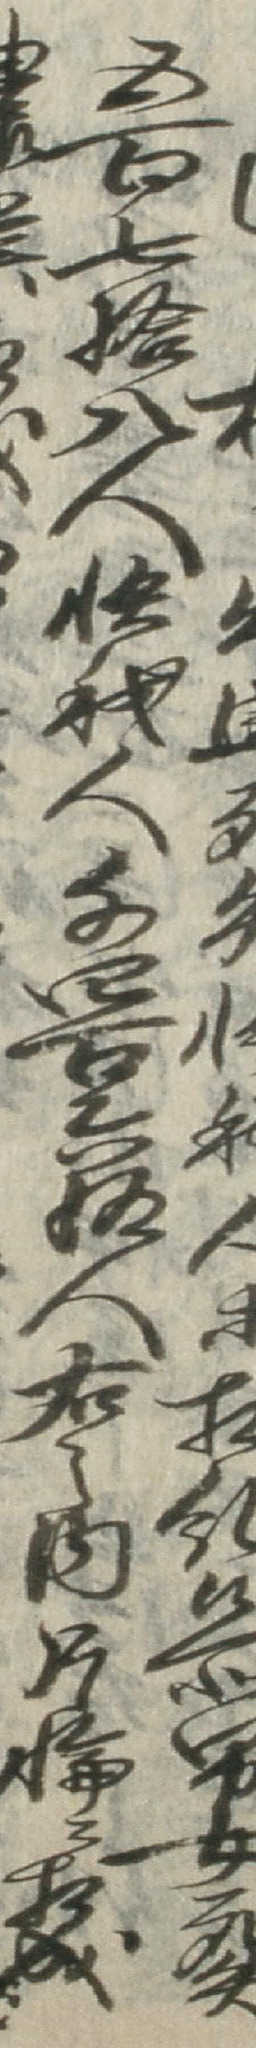五百七拾八人怪我人千四百六拾人右之内片輪二相成
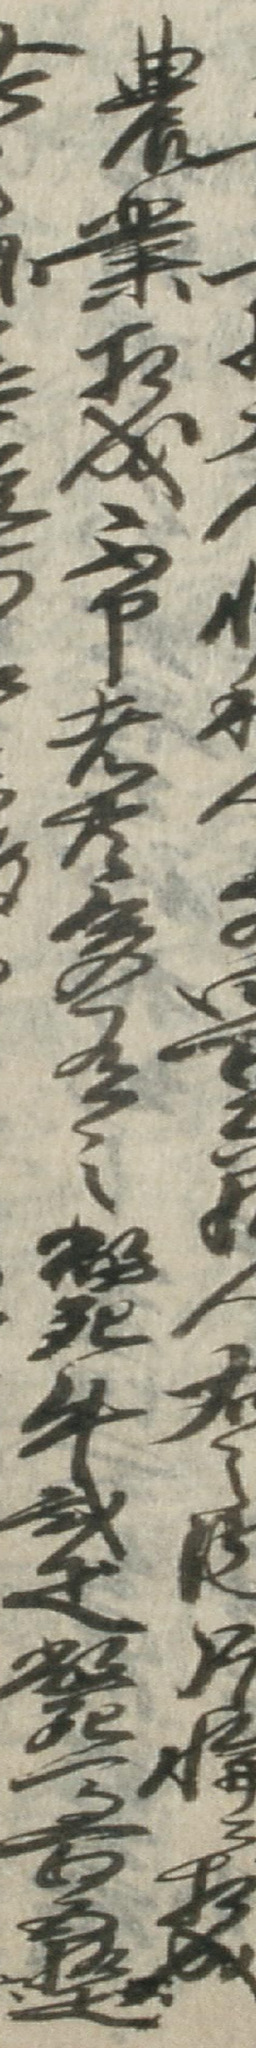農業相成不申者共多有之斃牛弐疋斃馬百五拾六疋
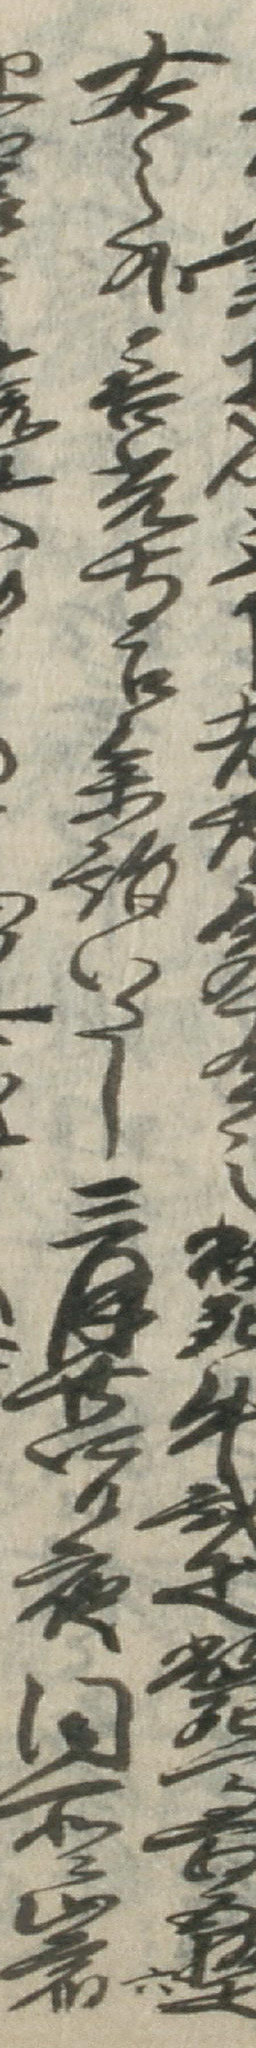右之外善光寺江参詣いたし三月廿四日夜同所二止宿
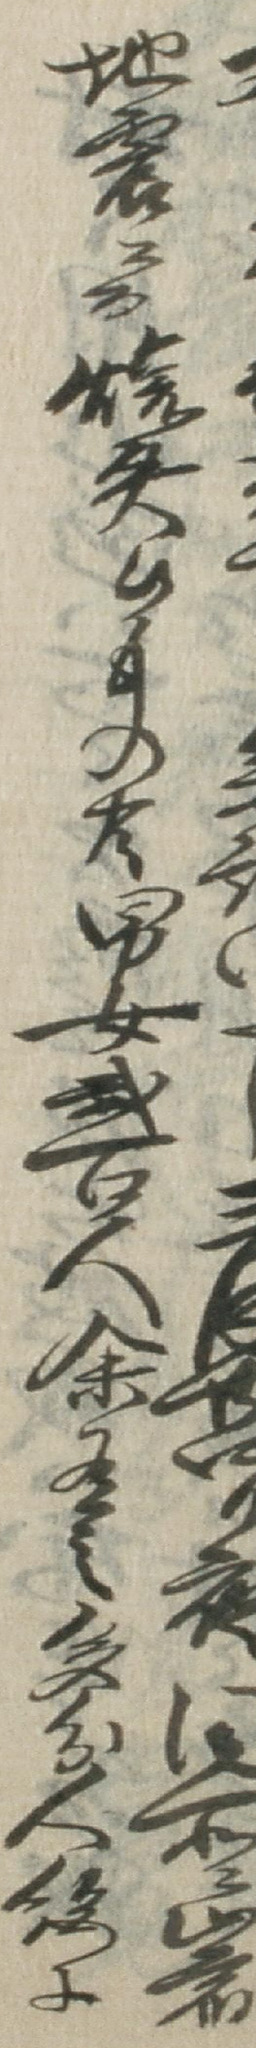地震二而焼失候もの共男女弐百人余有之多分人絶に
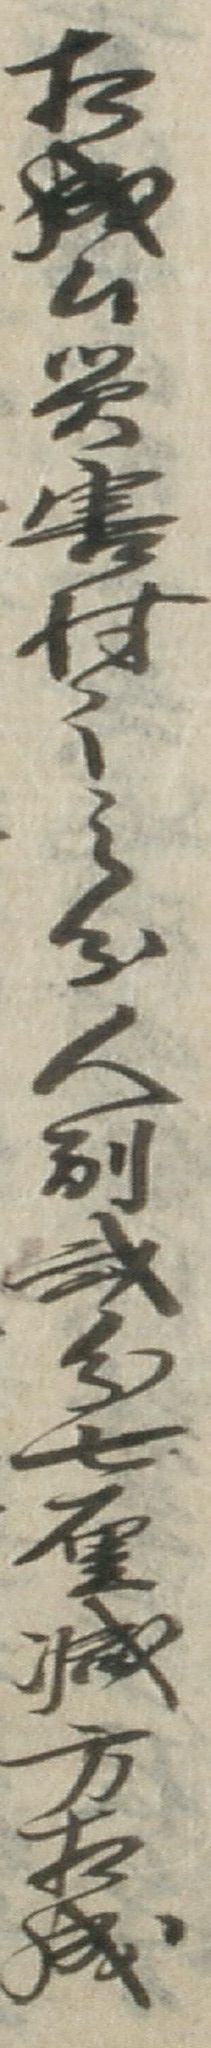相成候災害村々之分人別弐分七厘減方相成
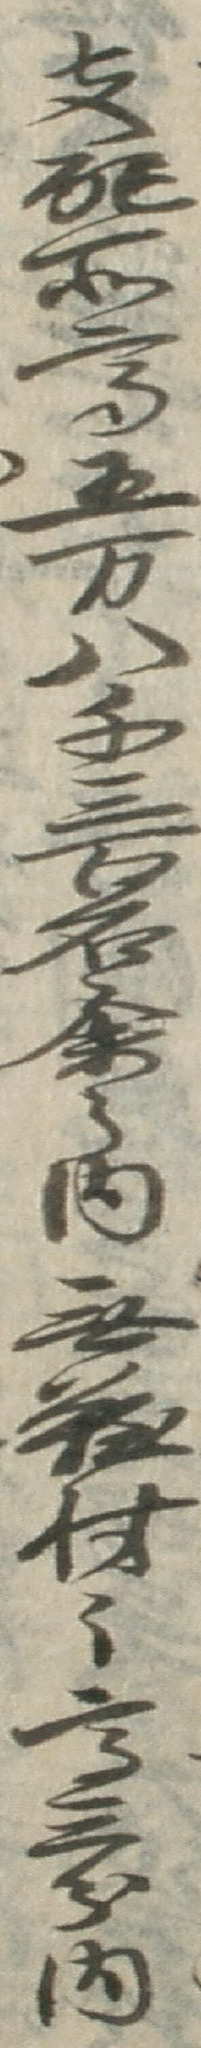支配所高五万八千三百石余之内無難村々高三分内
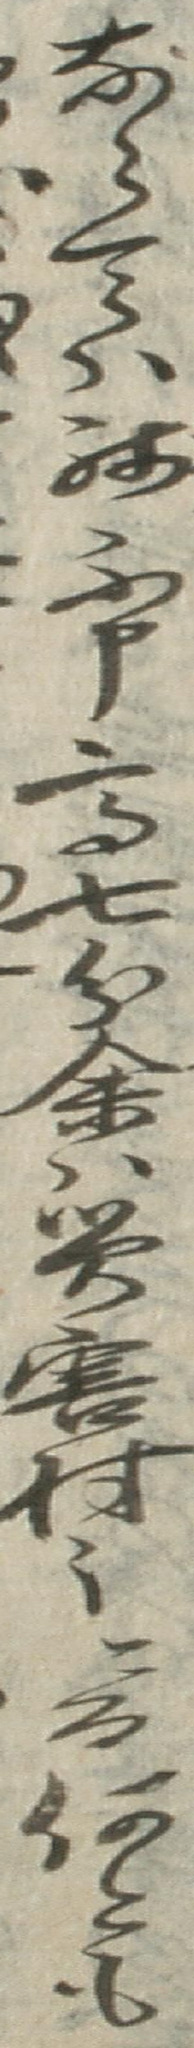ならては残不申高七分余は災害村々二而何とも
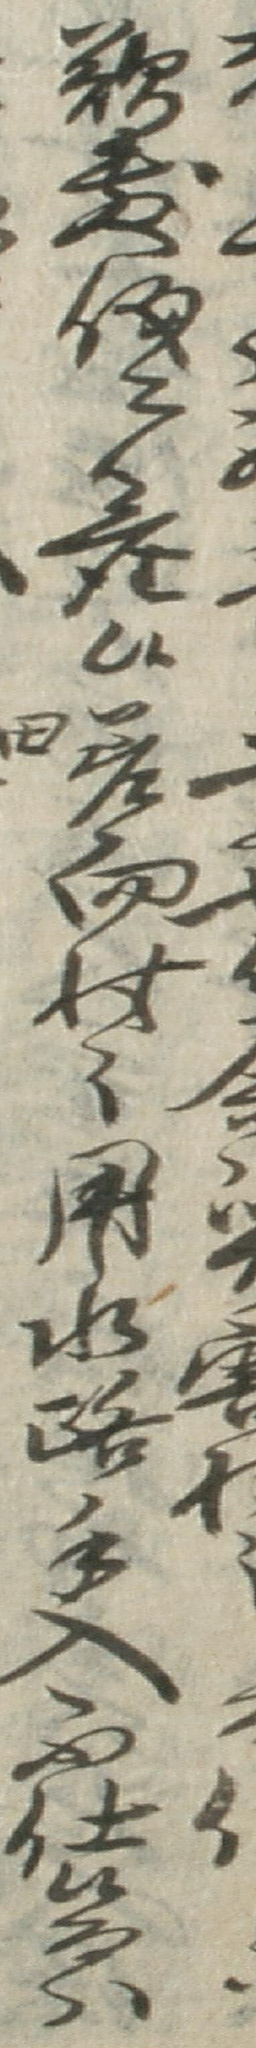嘆敷儀二御座候差向村々用水路手入不仕候而は
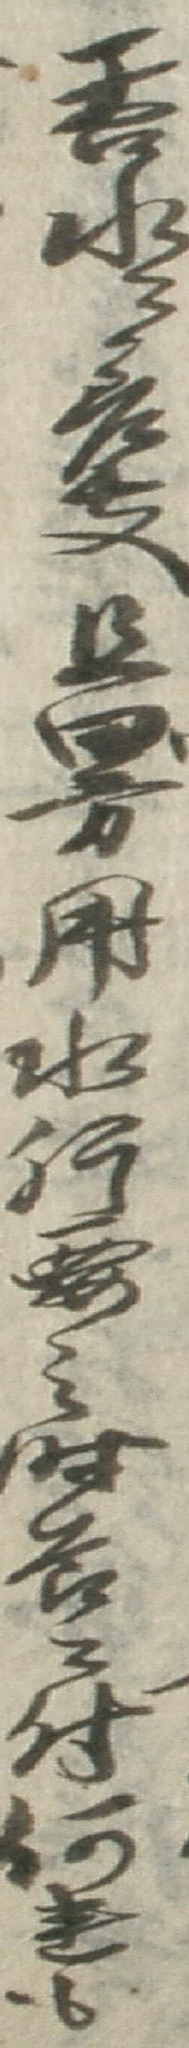呑水二差支且田方用水肝要之時節二付何れも
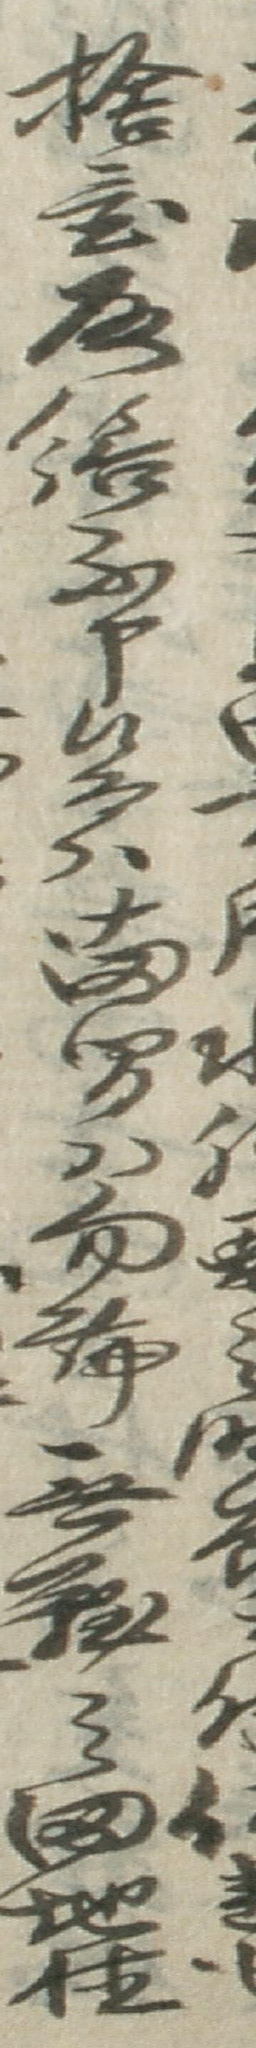捨置取繕不申候而は苗間は勿論無難之田地植
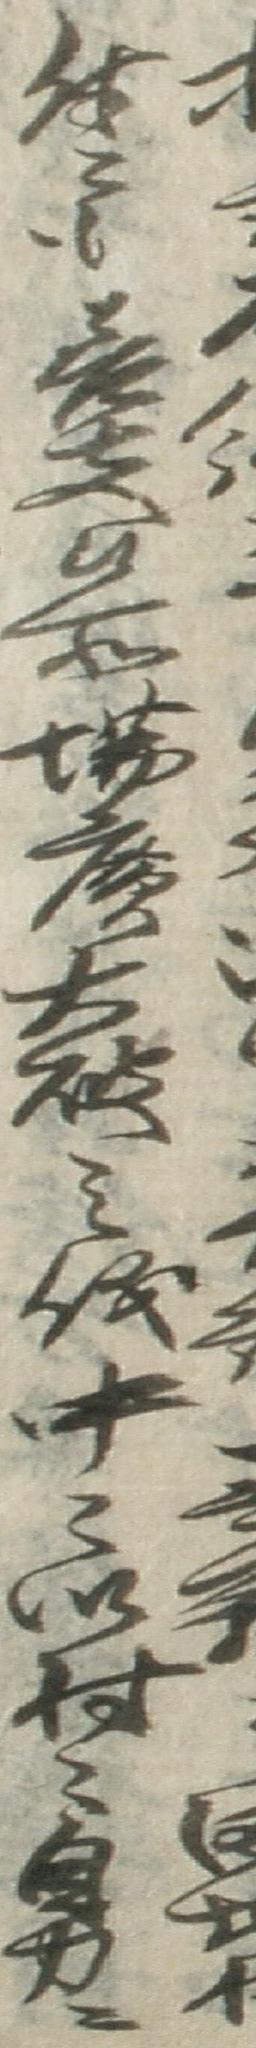付二も差支候所場広大破之儀中々以村々自力二
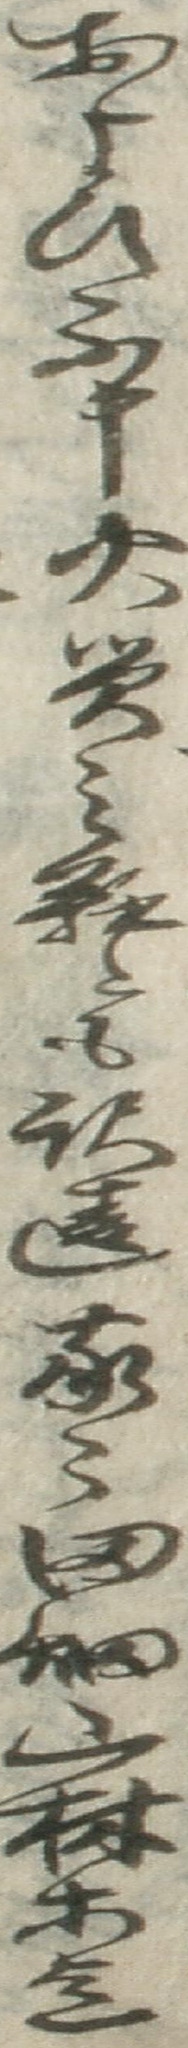およひ不申火災之難とも訳違家々田畑山林等迄
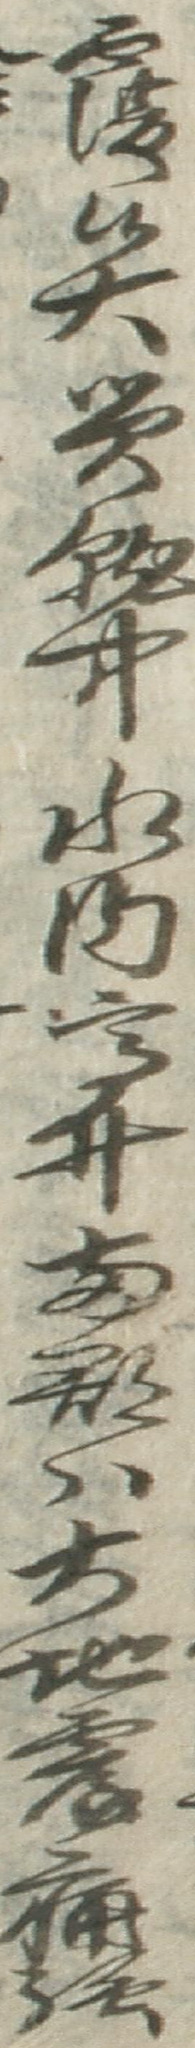覆候大災就中水内高井両郡は大地震痛強
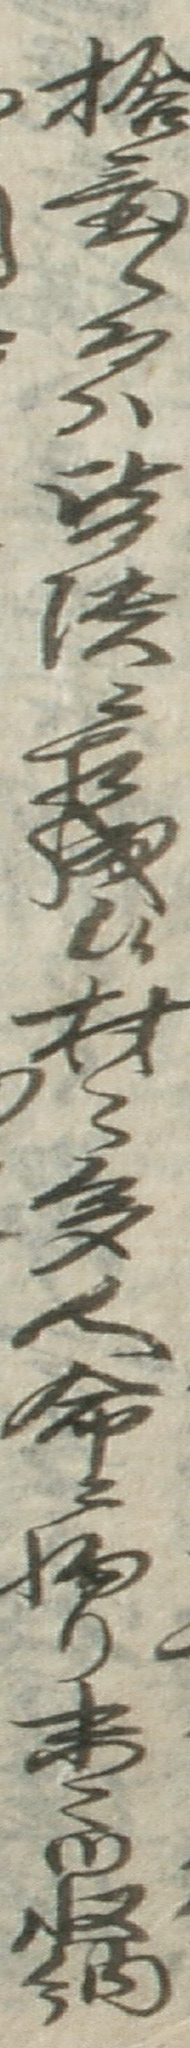捨置候而は皆潰二相成候村々多人命二拘り末々御収納
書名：信濃國地震實録記
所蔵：東京大学地震研究所図書室 Earthquake Research Institute Library, The University of Tokyo, JAPAN
